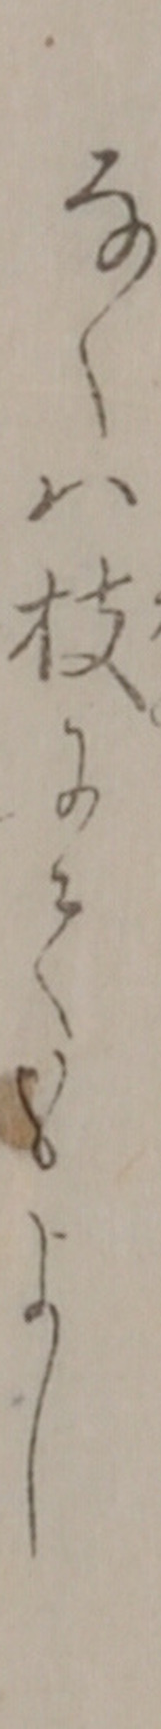なくは枝にてもよし
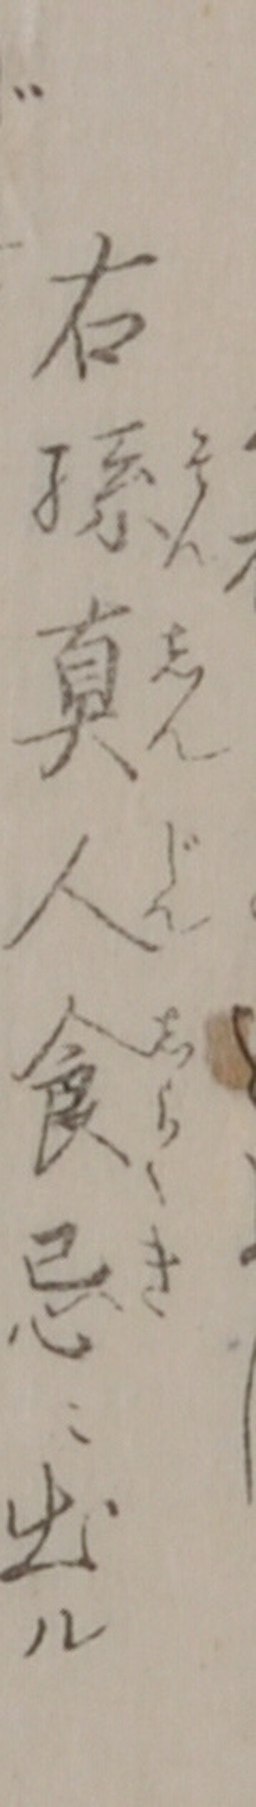右孫真人食忌に出ル
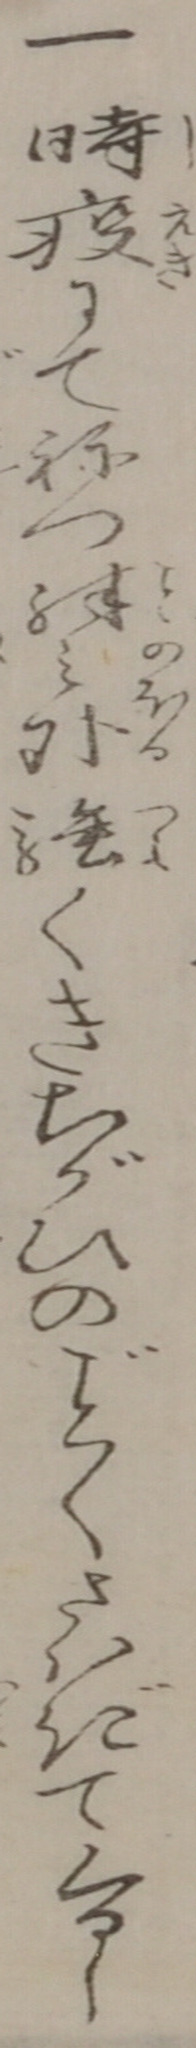一時疫にてねつ殊之外強くきちがひのごとくさはぎてくるし
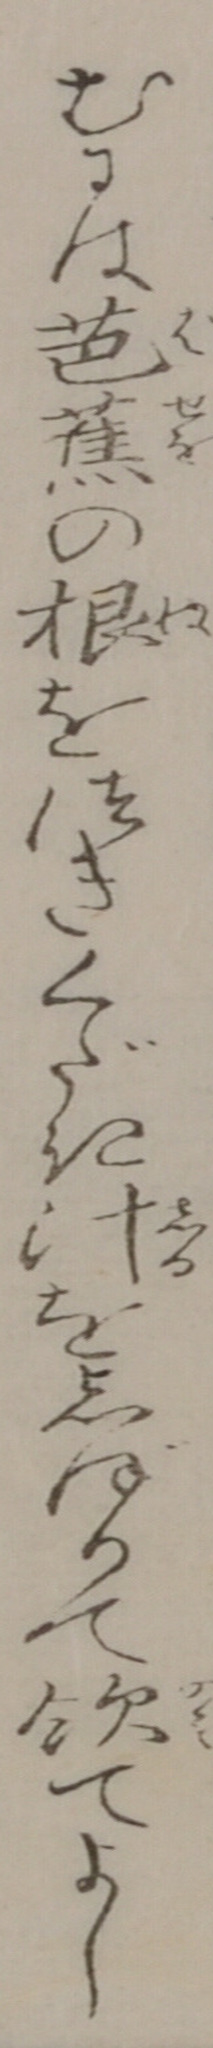むには芭蕉の根をつきくだき汁をしぼりて飲てよし
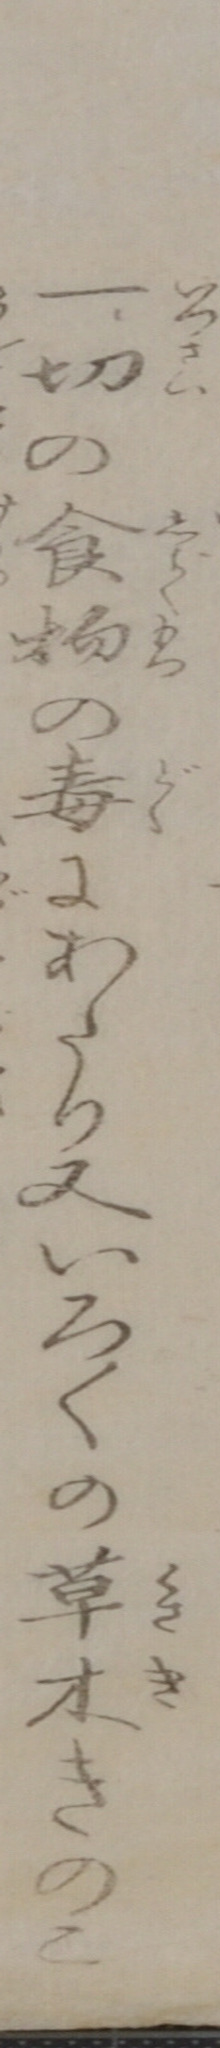一切の食物の毒にあたり又いろ〱の草木きのこ
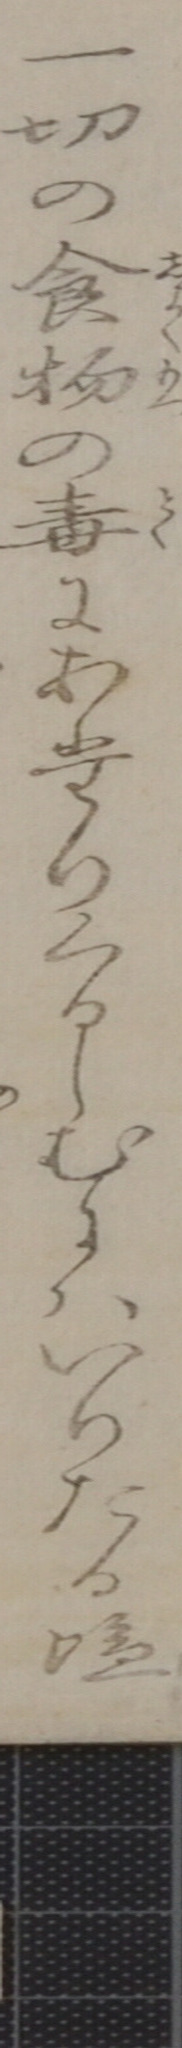一一切の食物の毒にあたりくるしむにはいりたる塩
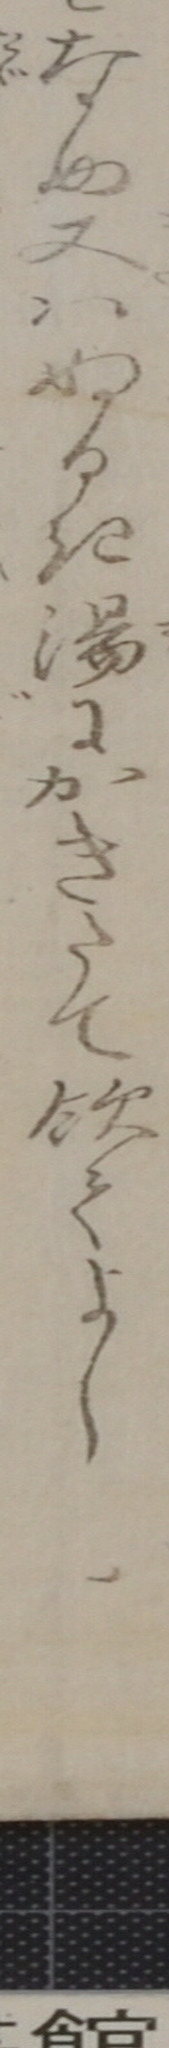をなめ又はぬるき湯にかきたて飲てよし

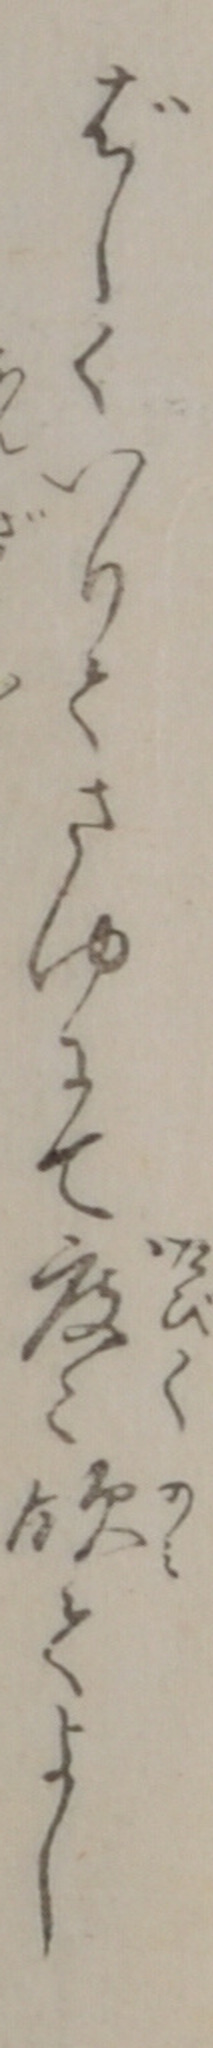ばしくいりてさゆにて度々飲てよし
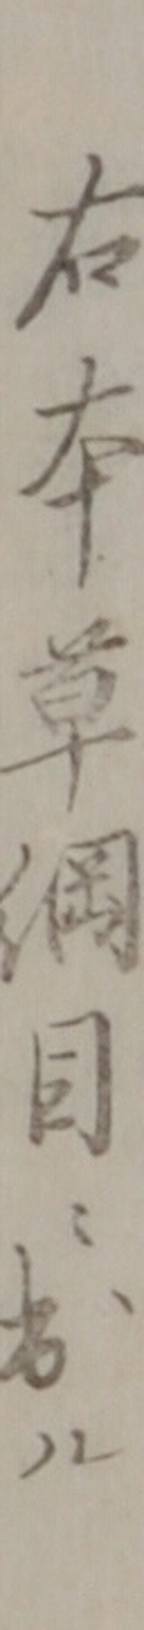右本草綱目に出ル
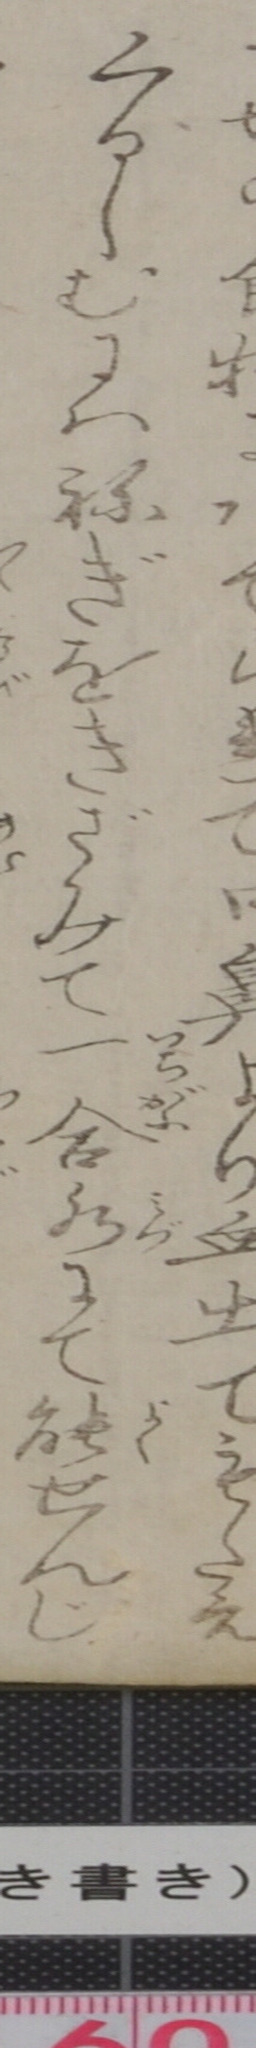くるしむにはねぎをきざみて一合水にて能せんじ
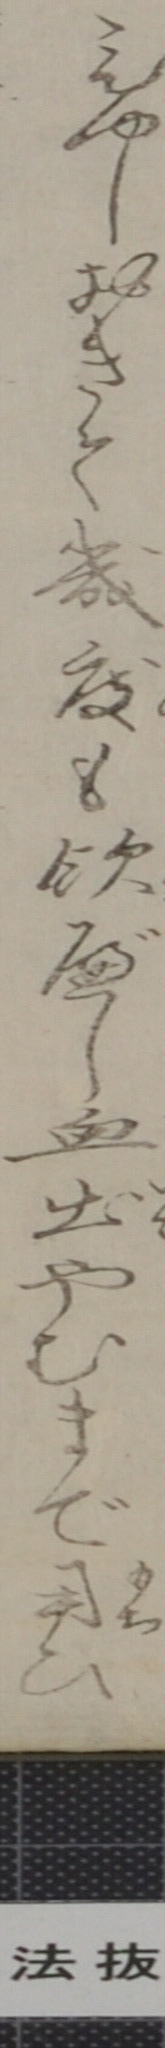ひやしおきて幾度も飲べし血出やむまで用ひ
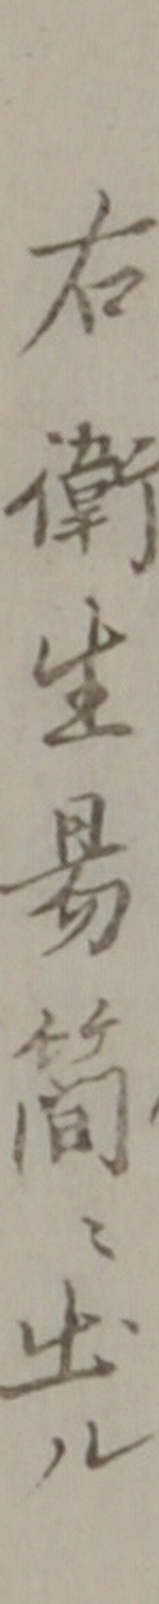右衛生易簡に出ル
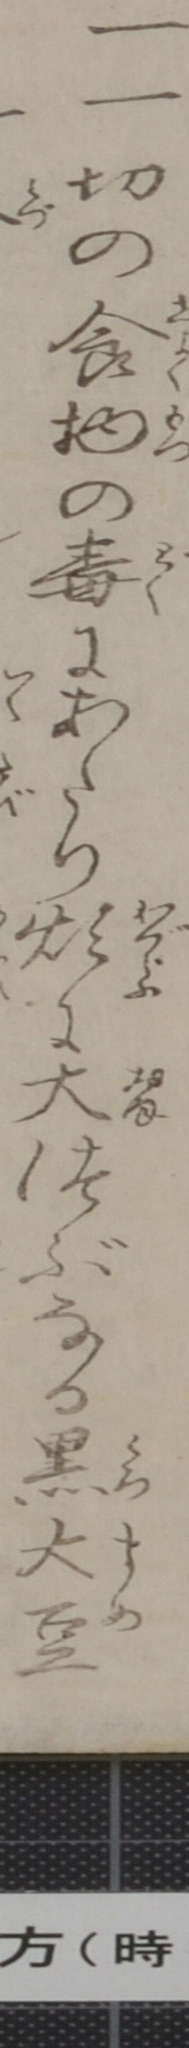一一切の食物の毒にあたり煩に大つぶなる黒大豆
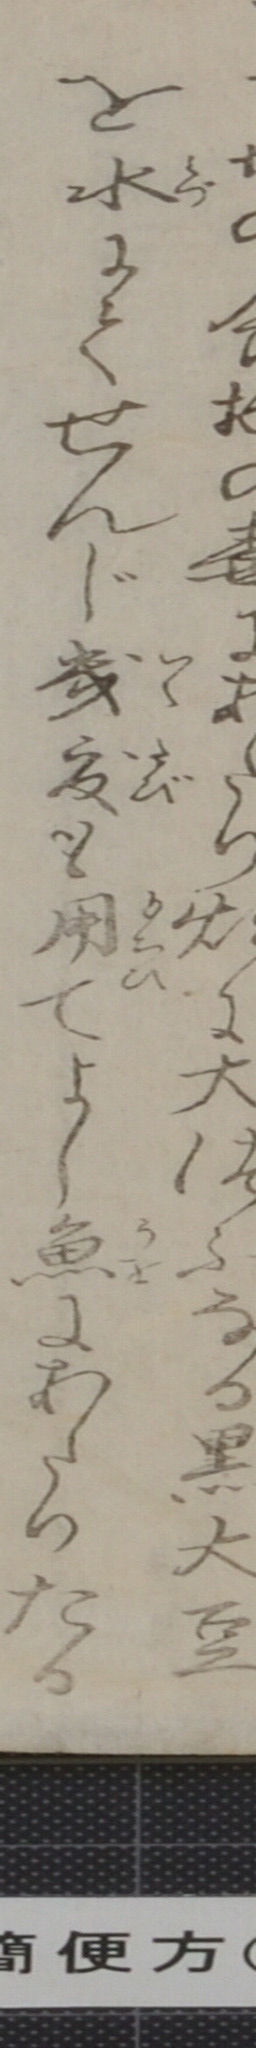を水にてせんじ幾度も用てよし魚にあたりたる
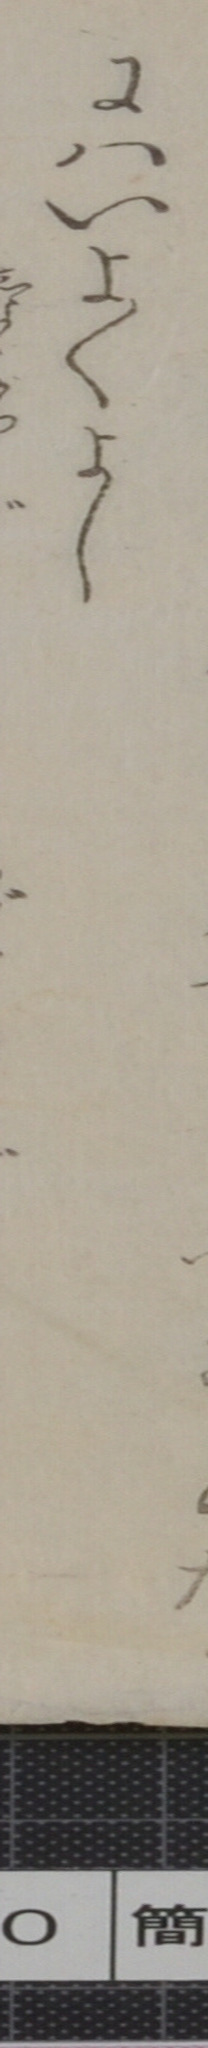にはいよ〱よし
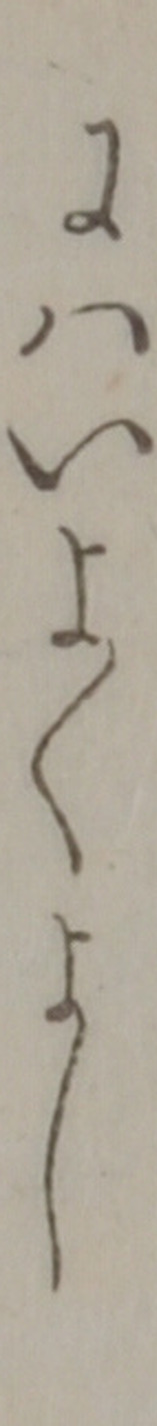にはいよ〱よし
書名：簡便方
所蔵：伊那市立高遠町図書館・合同会社AMANE
